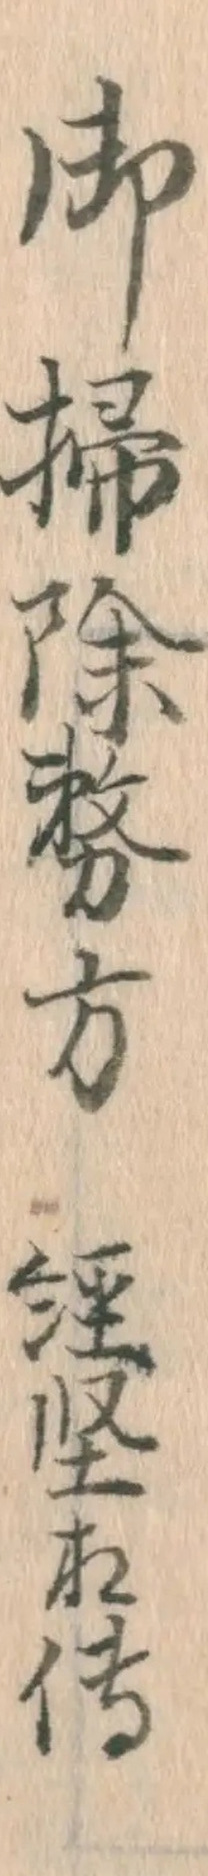御掃除務方経堅相傳
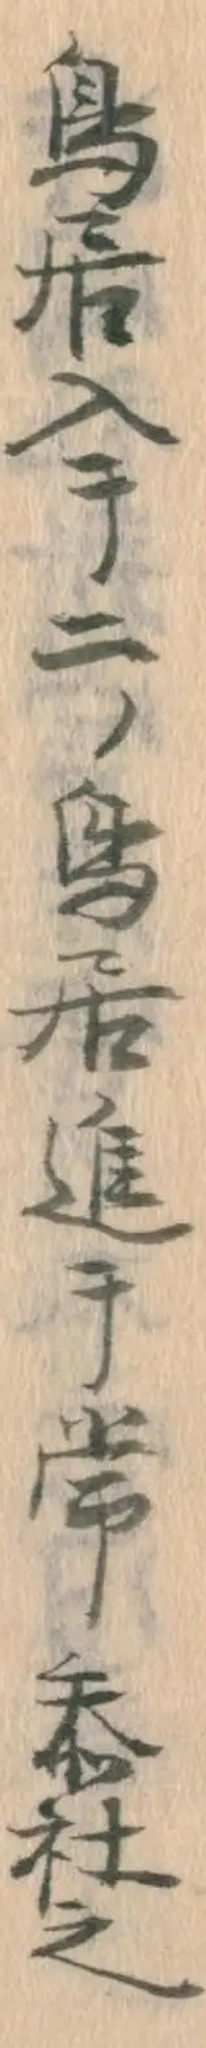鳥居入于二ノ鳥居進于常参社也
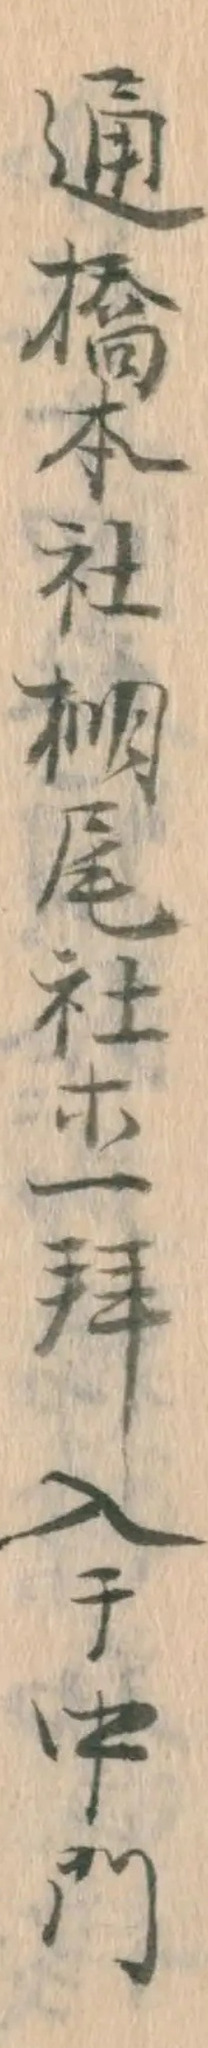通橋本社棚尾社等一拝入于中門
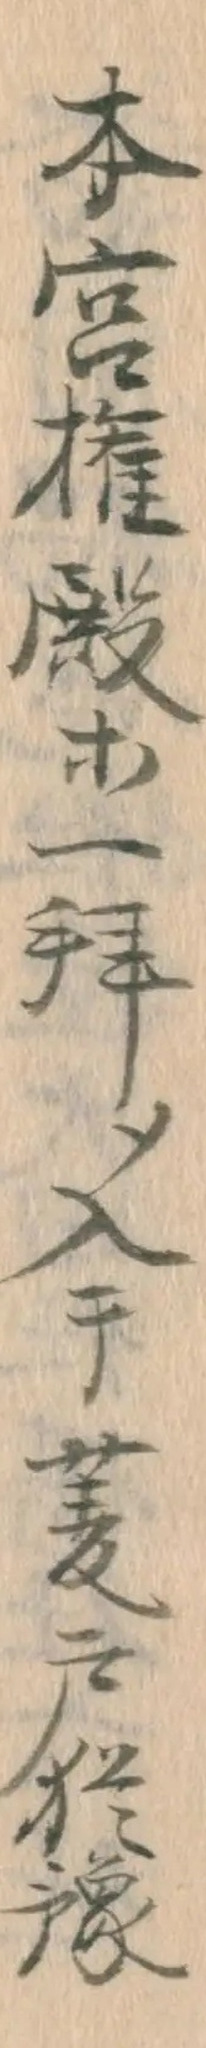本宮権殿等一拝〆入于菱戸猶予
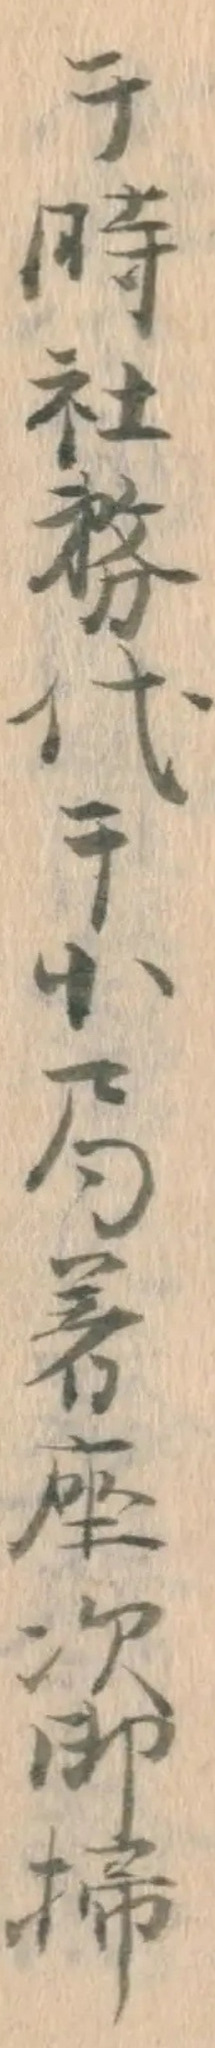于時社務代于小局着座次御掃
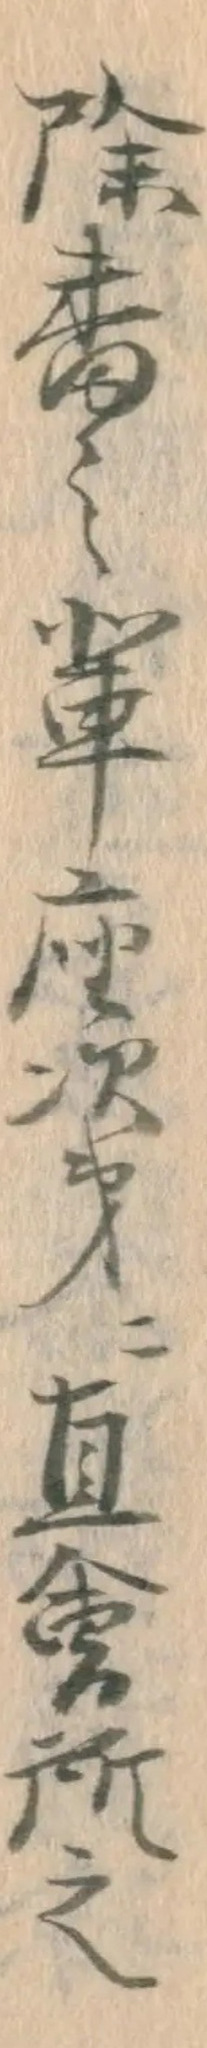除番之輩座次第ニ直會所之
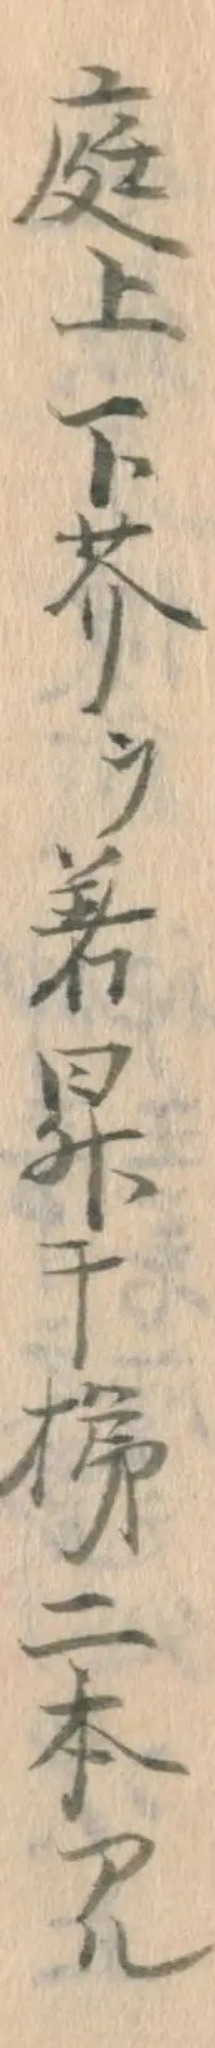庭上下芥ヲ着昇于梯二本アル
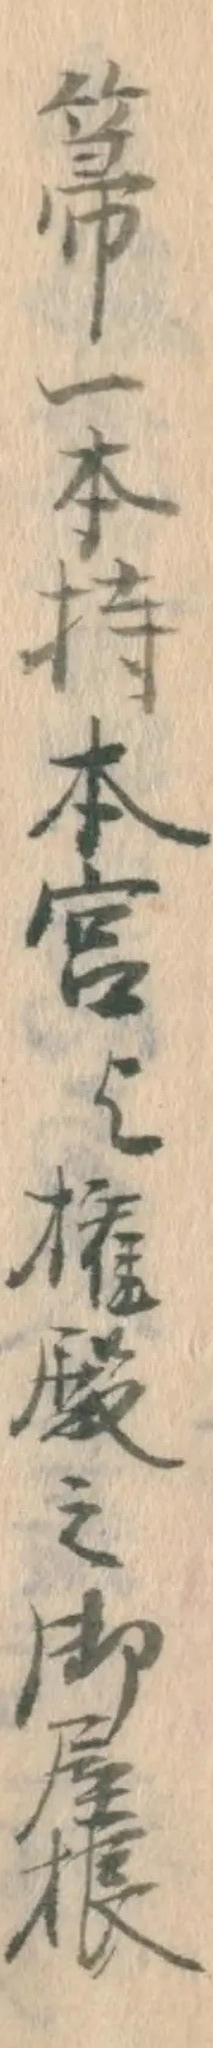箒一本持本宮と権殿之御屋根
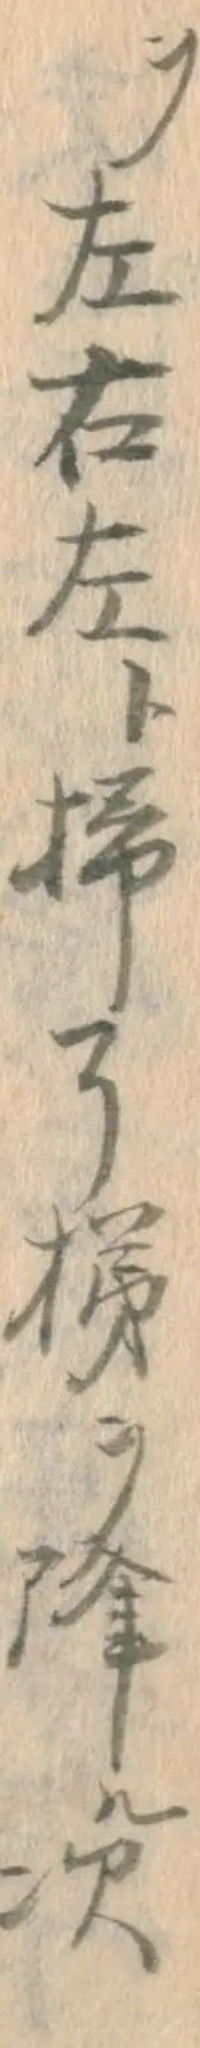ヲ左右左と掃了梯ヲ降ル次
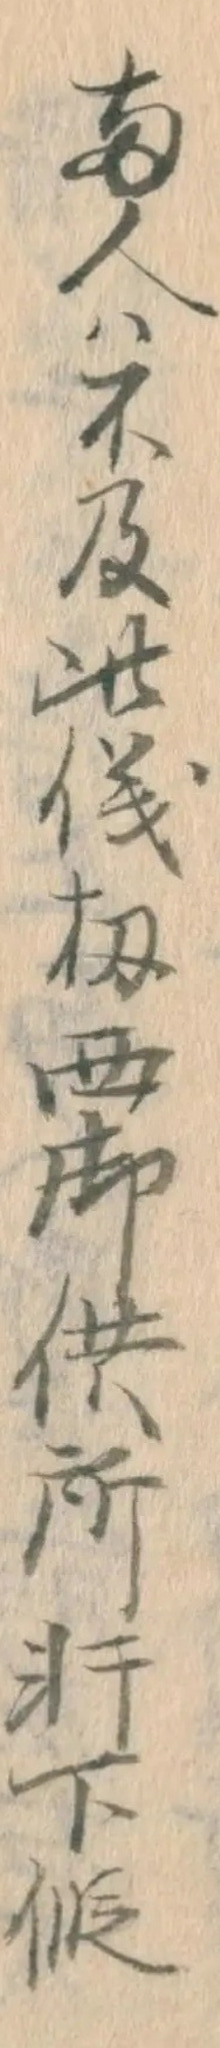両人ハ不及此儀扨西御供所軒下仮
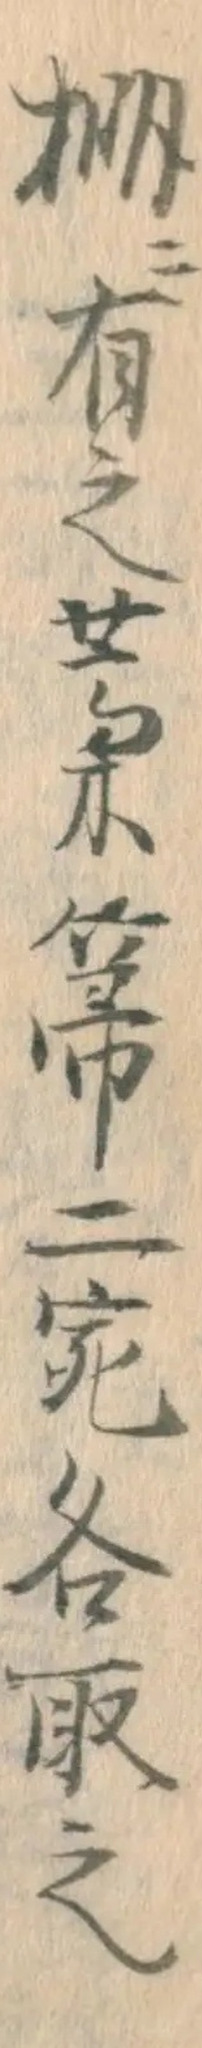棚ニ有之藁箒二宛各取之
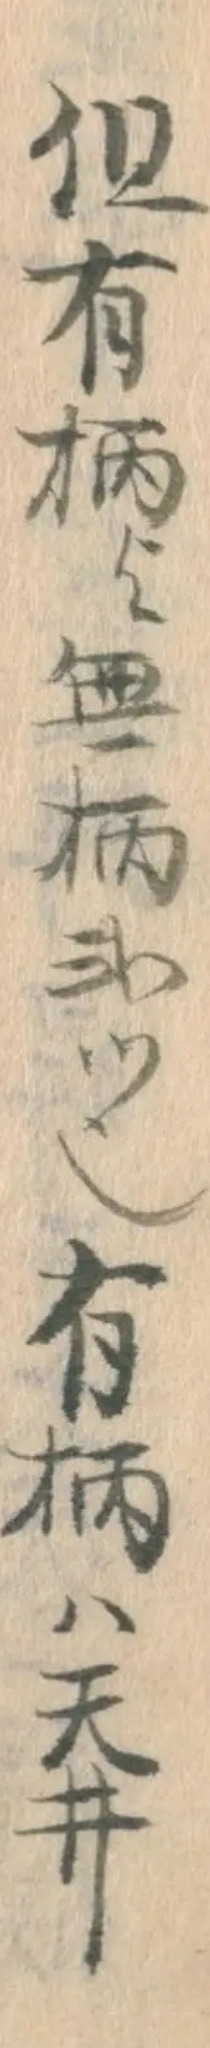但有柄与無柄弐ツ也有柄ハ天井
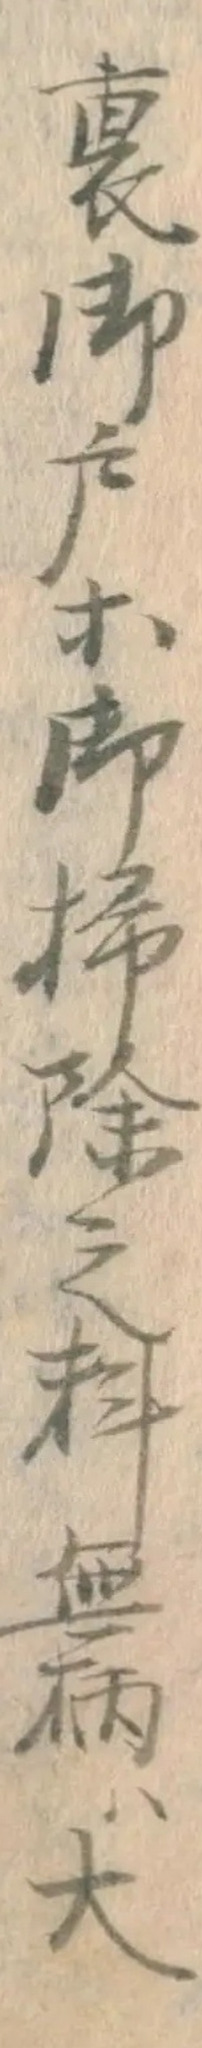裏御戸等御掃除之料無柄ハ大
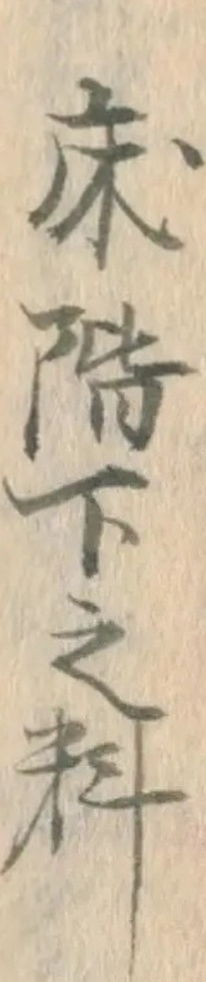床階下之料

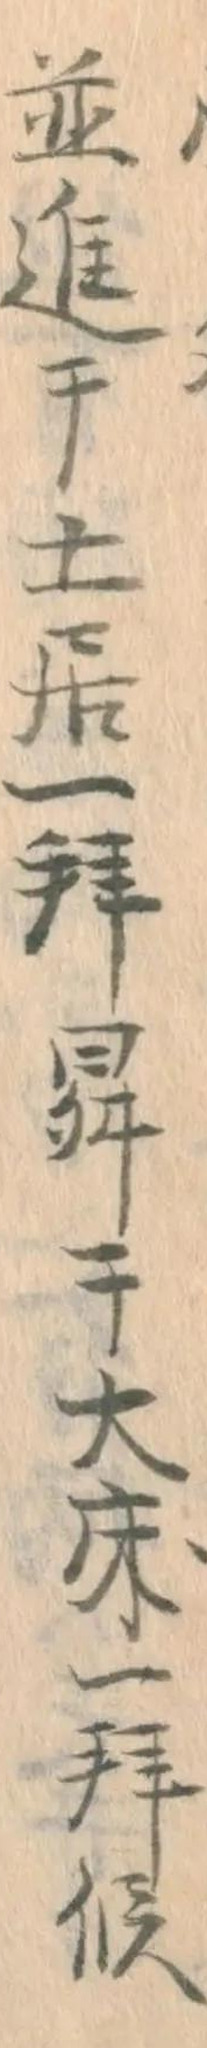並進于土居一拝昇于大床一拝候
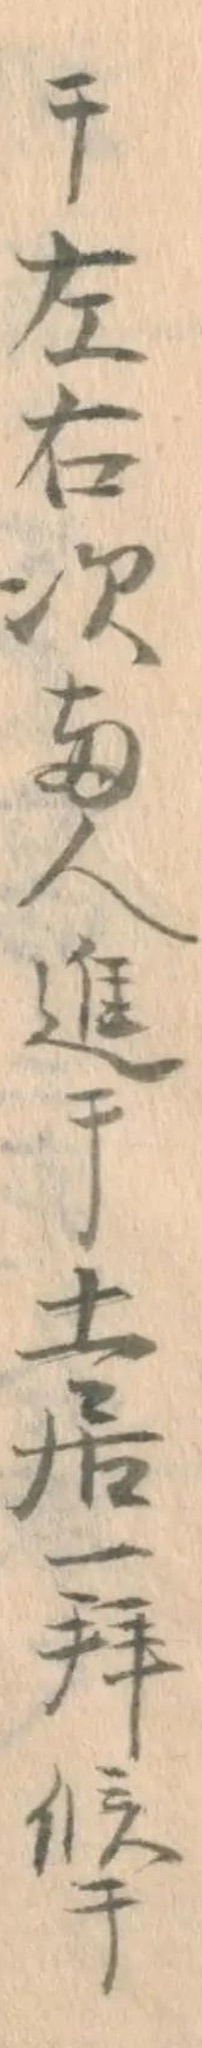于左右次両人進于土居一拝候于
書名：賀茂社記録. 第81冊
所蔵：国立国会図書館 National Diet Library, JAPAN
